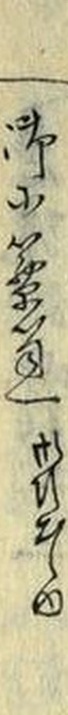御小箪笥一御引出之内
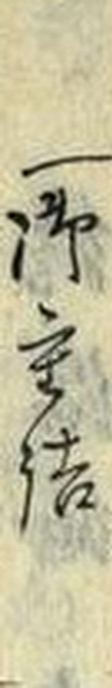御重詰
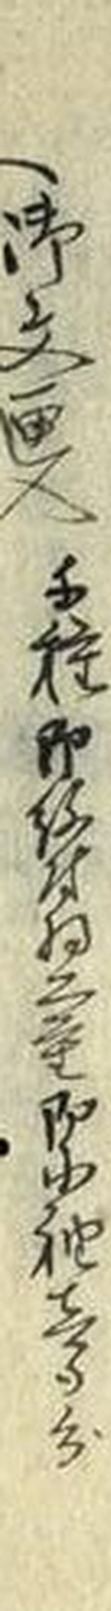同同御文匣入千種御紋付羽二重御小袖壱ツ分
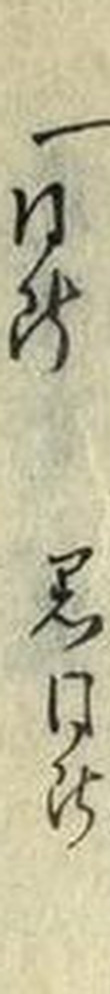同断黒同断
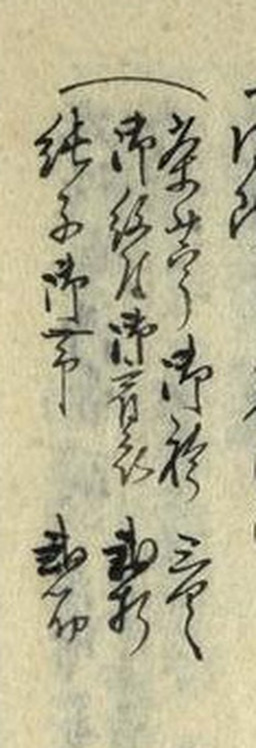御紋付御肩衣弐折
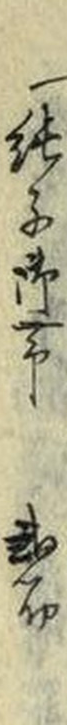純子御帯弐筋

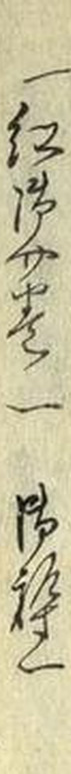紅御介巻一御褥一
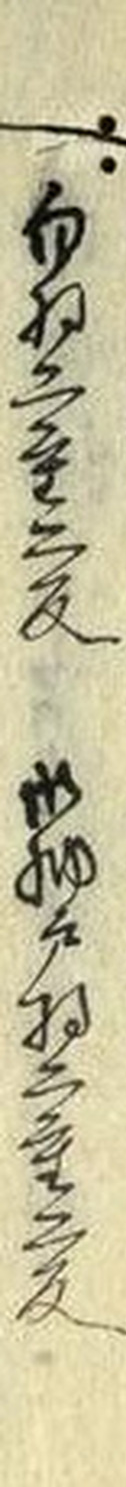白羽二重二反御納戸羽二重二反
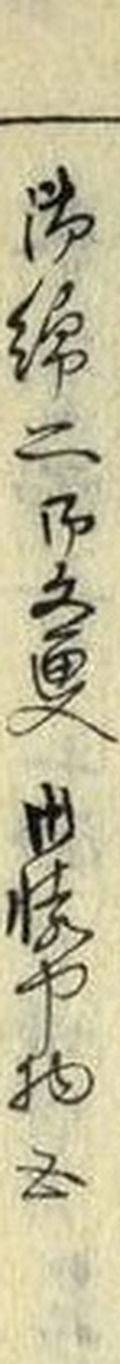御綿二御文匣入御懐中物五
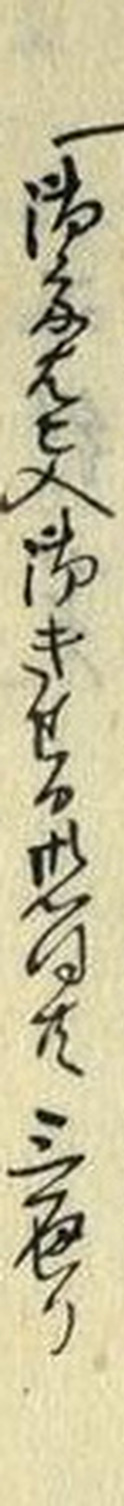御たはこ入御きせる御筒共三通り
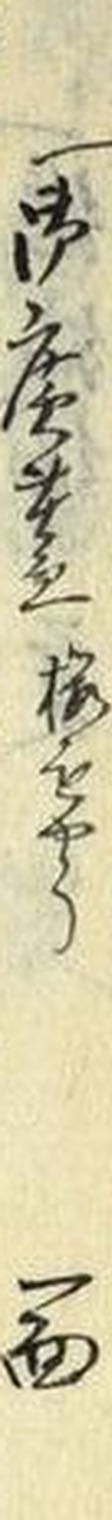御広蓋桜もやう一面
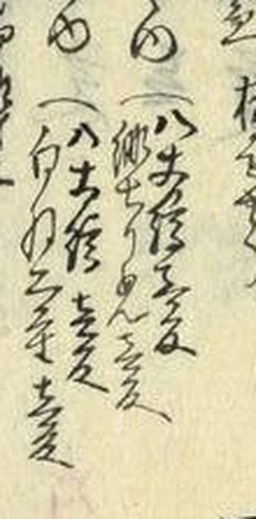緋ちりめん壱反
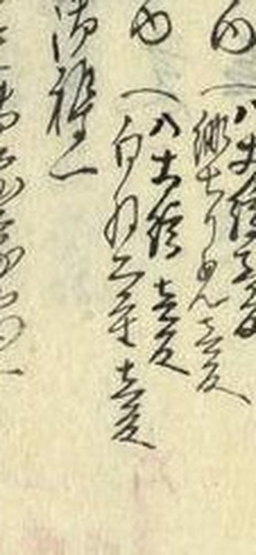白羽二重壱反
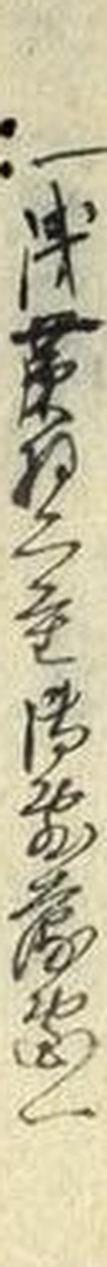浅黄羽二重御敷蒲団一
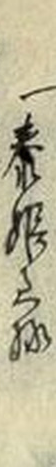泰姫君様
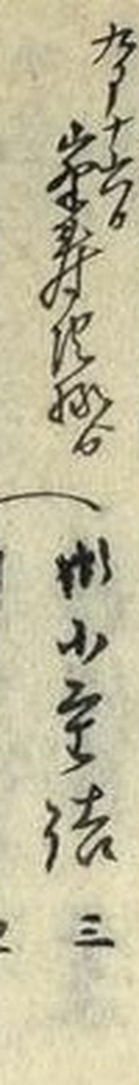九月十六日峯寿院様ゟ御小重詰三
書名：少傅日録抄（斉善付側向頭取日記、在府）
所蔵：福井県文書館 Fukui Prefectural Archives
